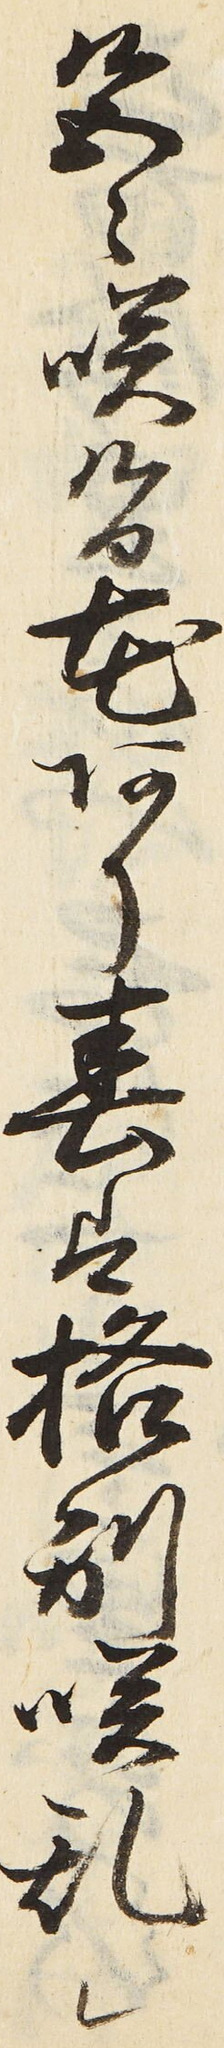色々咲ける花あり春は格別咲乱れ
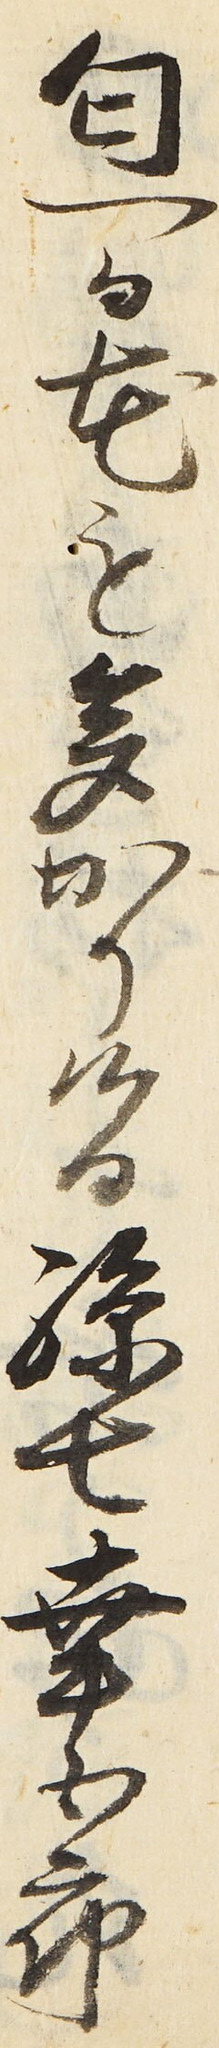匂へる花も多かける孫七幸五郎
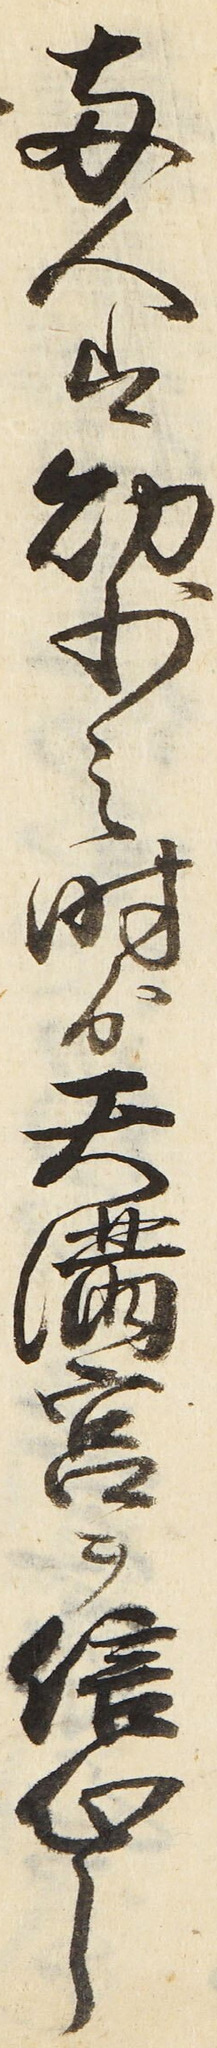両人は幼少の時より天満宮を信心し
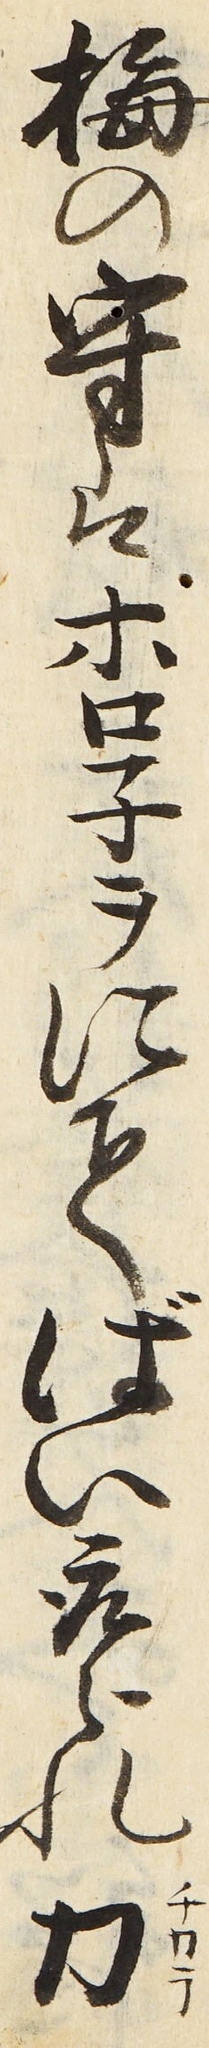梅の守はホロネヲにてばい取られ力
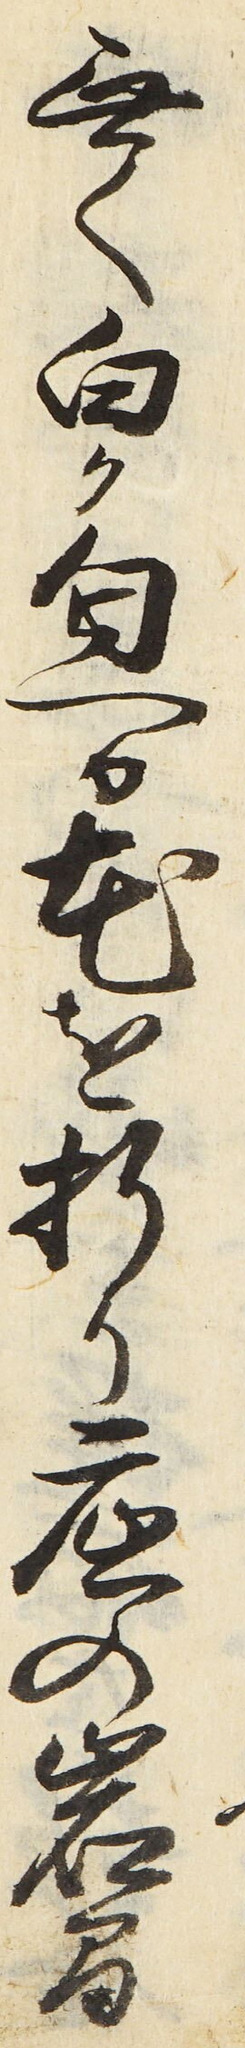無く白く匂へる花を折り底の岩間
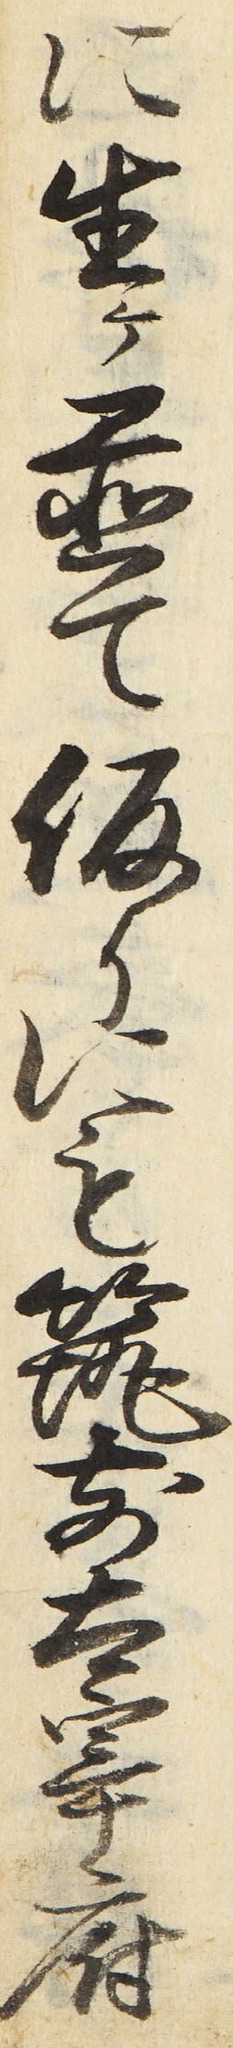に生け置て仮りにも筑前大宰府

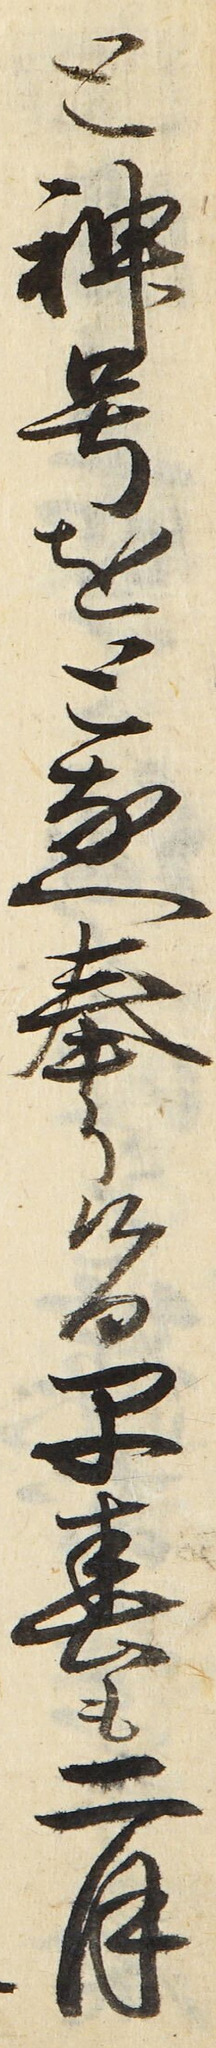と神号をとなへ奉りける早春も二月
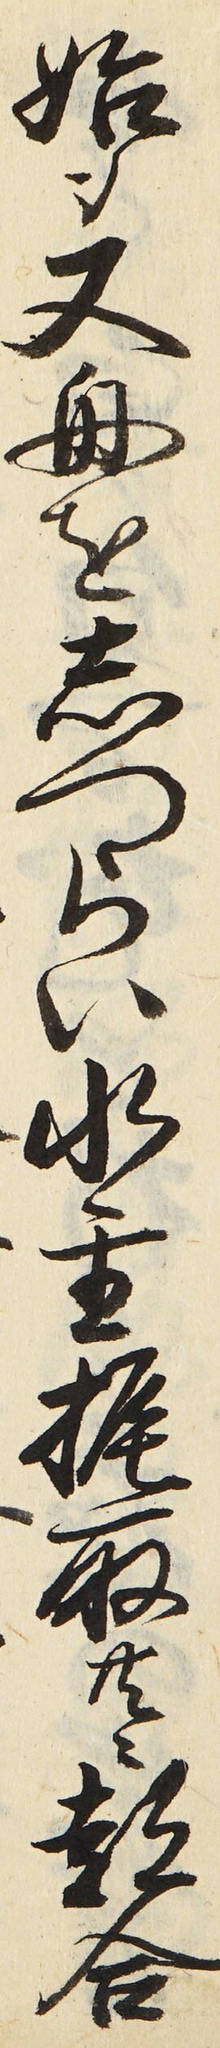始め又舟をしつらい水主梶取共々都合
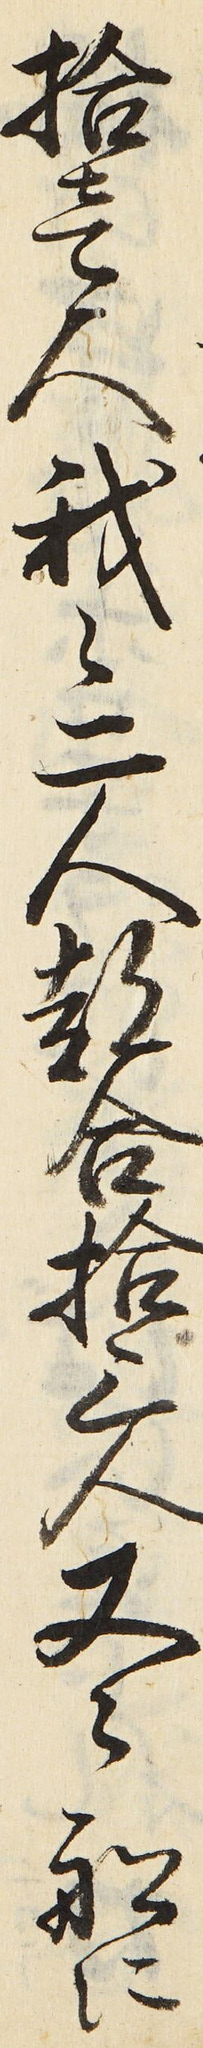拾壱人我々二人都合拾三人又々船に
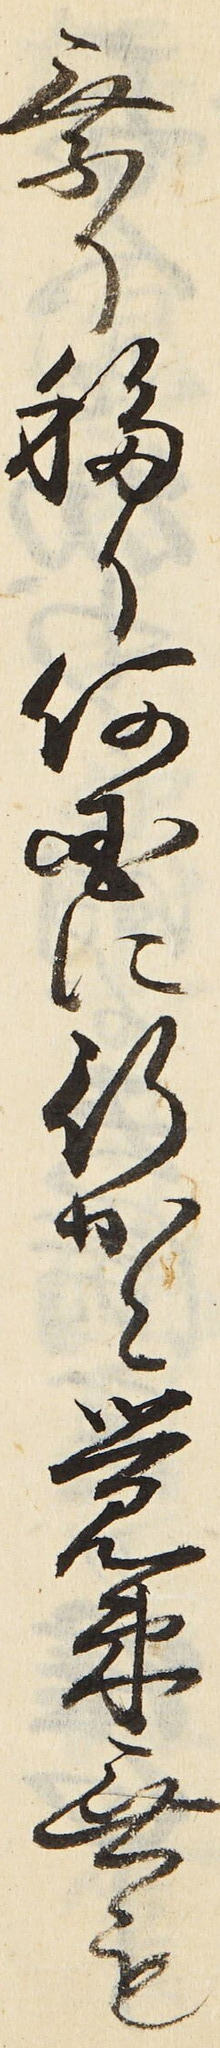乗り移り何国に行かと覚束無も
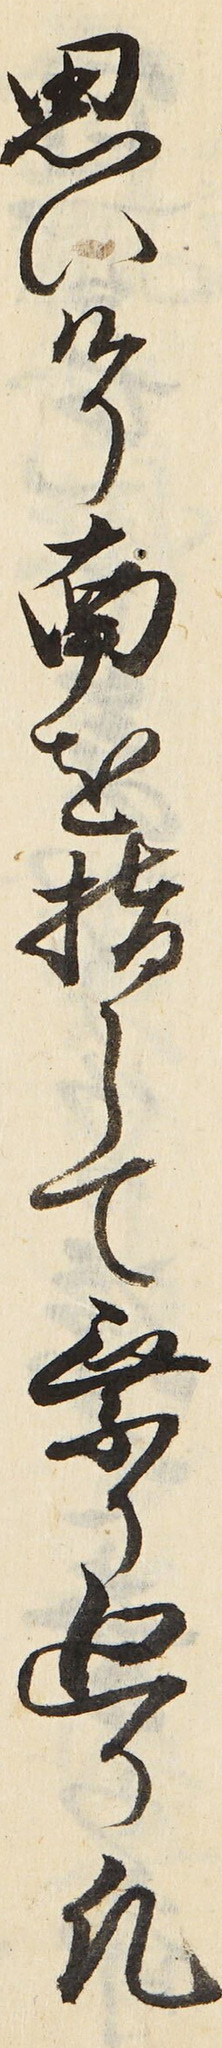思ひけり南を指して乗り廻り凡
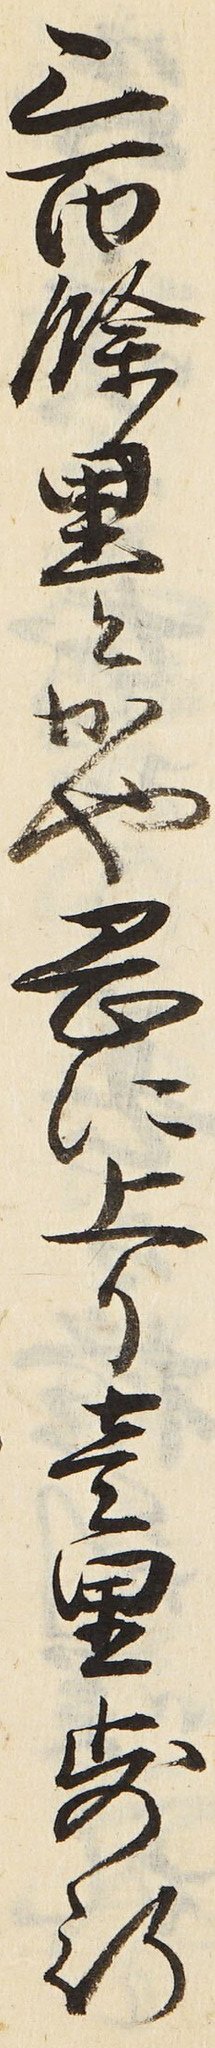三百余里とかや岡に上り壱里歩行
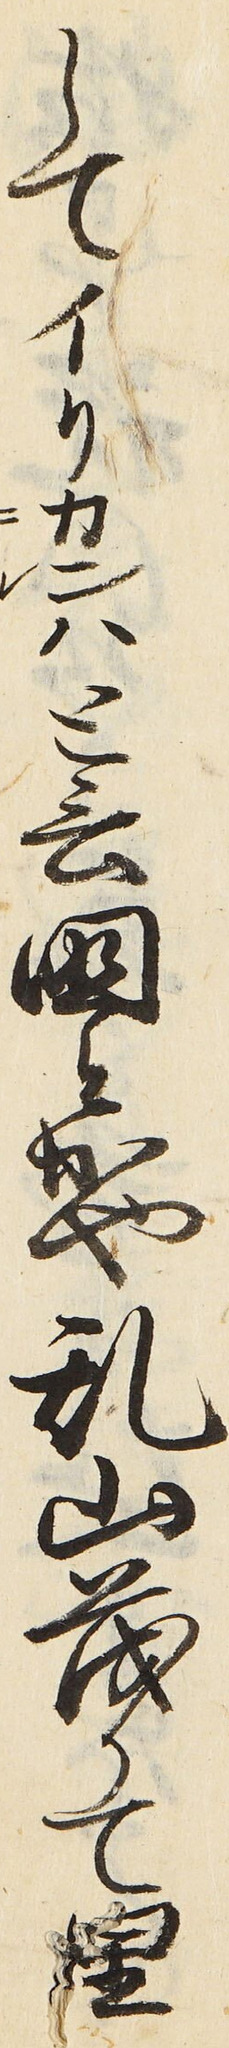してイリカンハと云国とかや乱山茂りて里
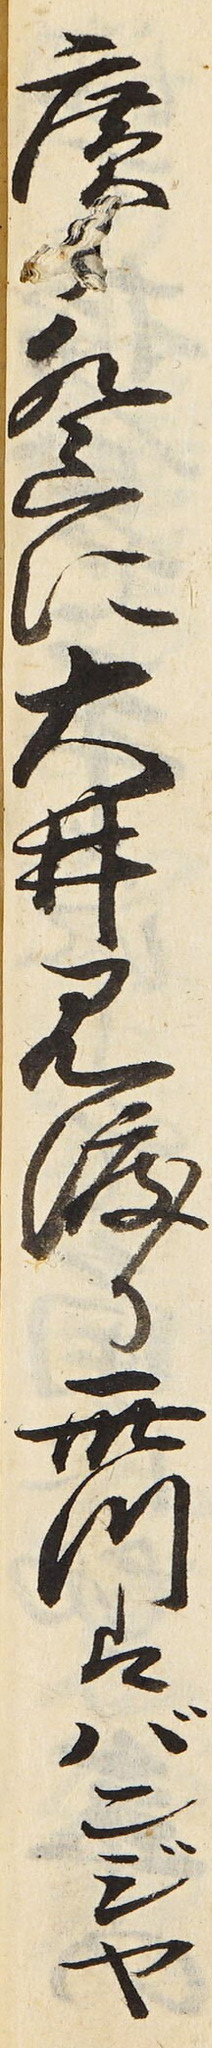広遥に大井見渡り此川はバンジヤ
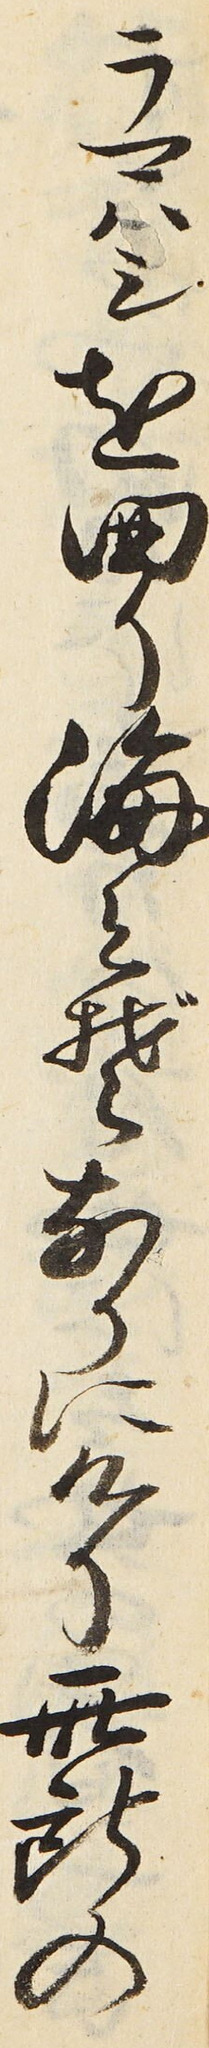ラマハシを回り海とぞなりにけり此所の
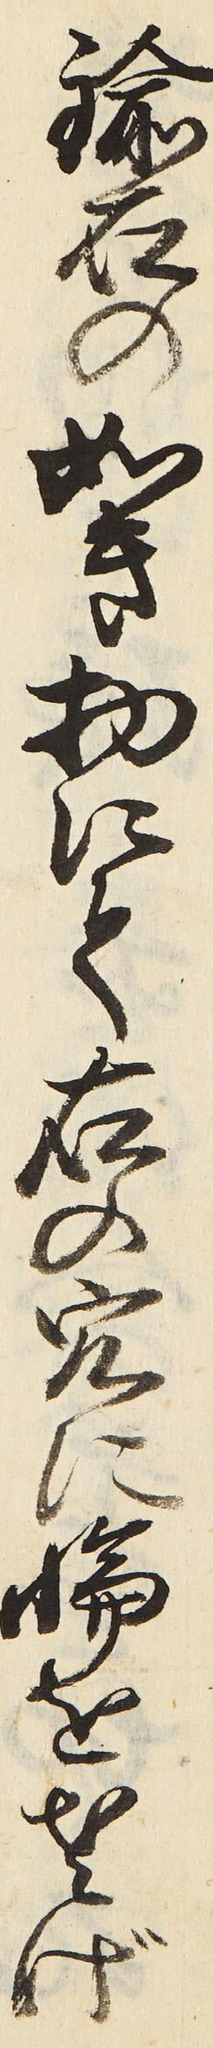鍮石の如き物にて右の穴に輪をさげ
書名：華夷九年録
